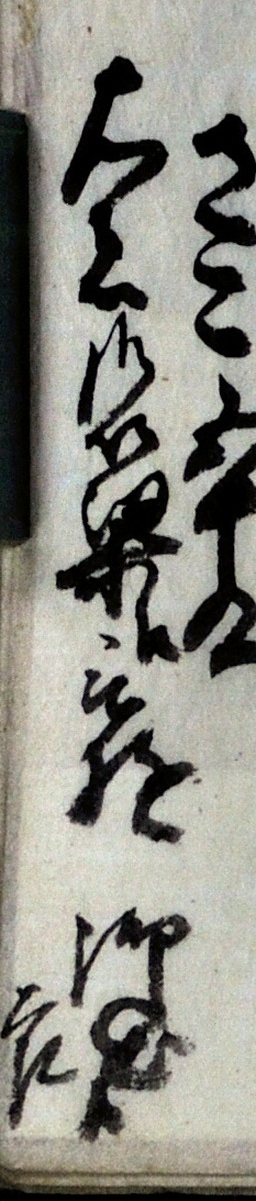右は御簗え被遊御出候節
